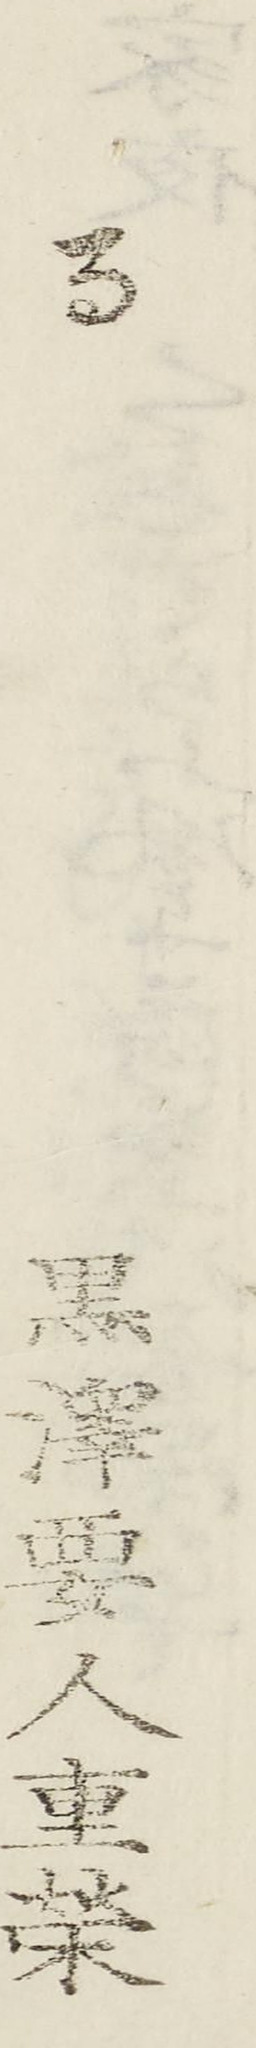る黒沢要人重栄
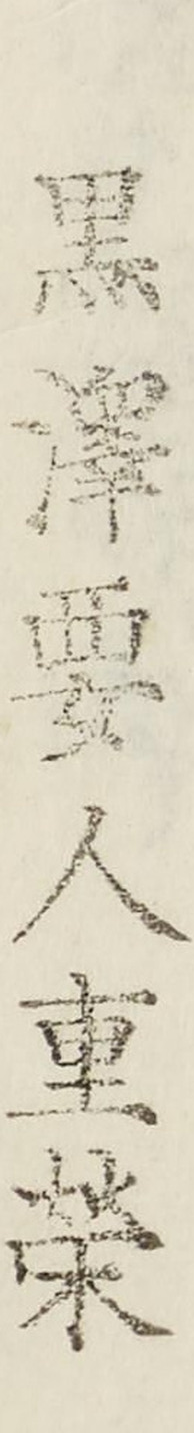る黒沢要人重栄
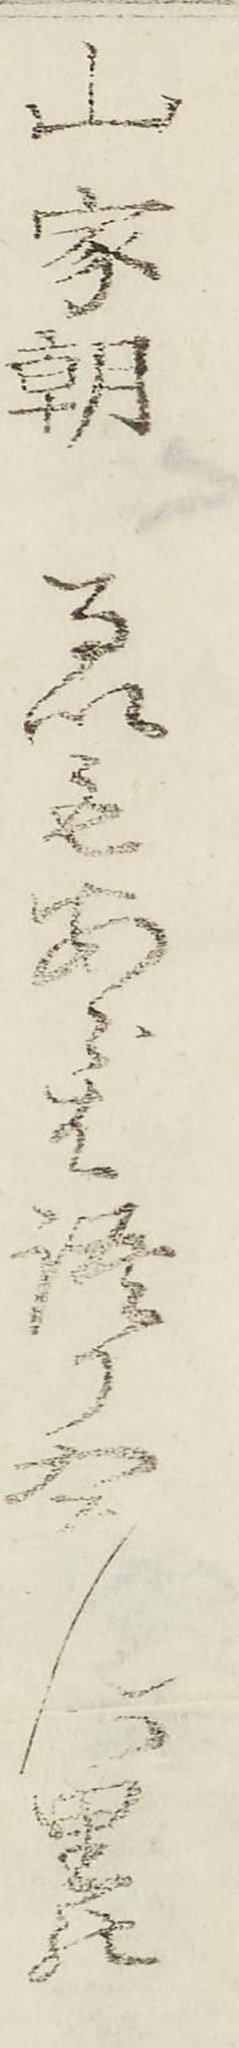山家朝るいもあらは語り合ん山？里の
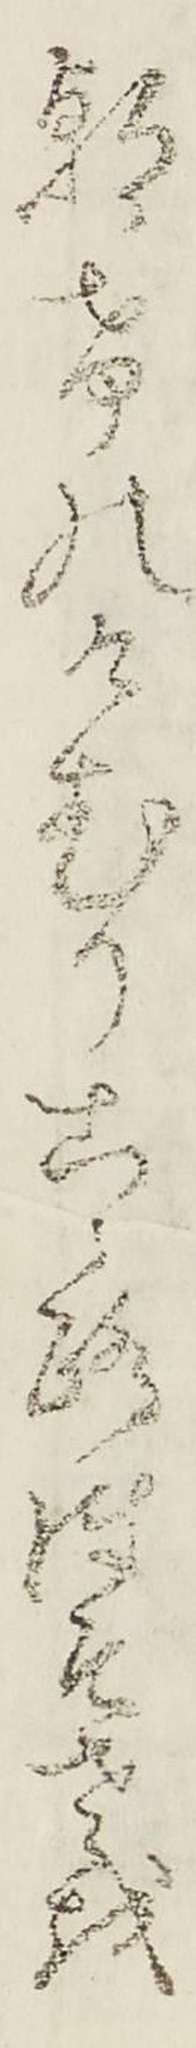朝けのけむりこゝろほそさを
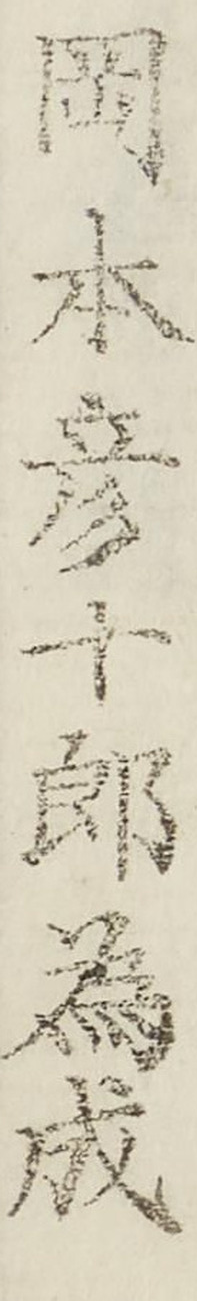り岡本彦十郎為成

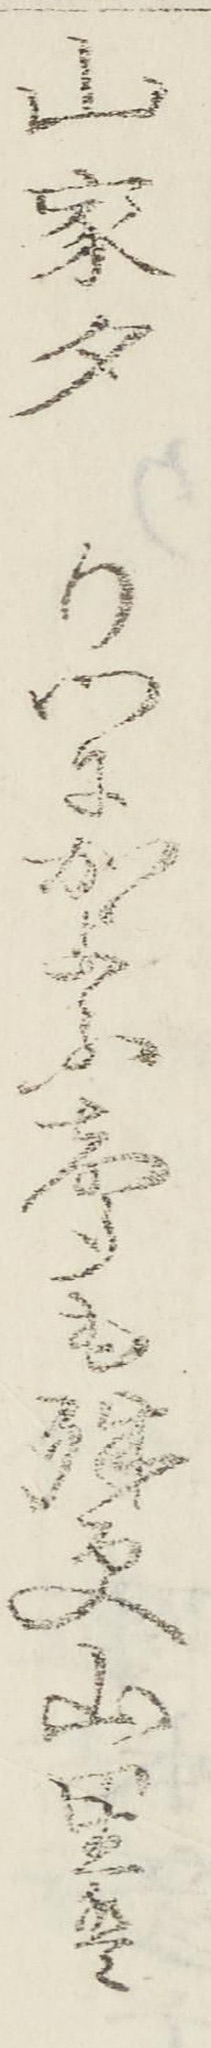山家夕りつにかよふ声も殊更山里は
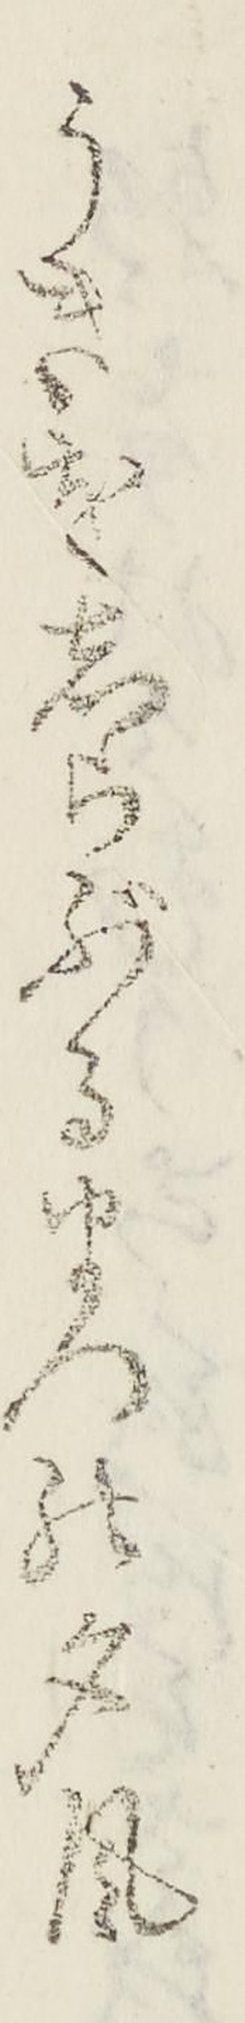うきをしらぶるまつの夕風
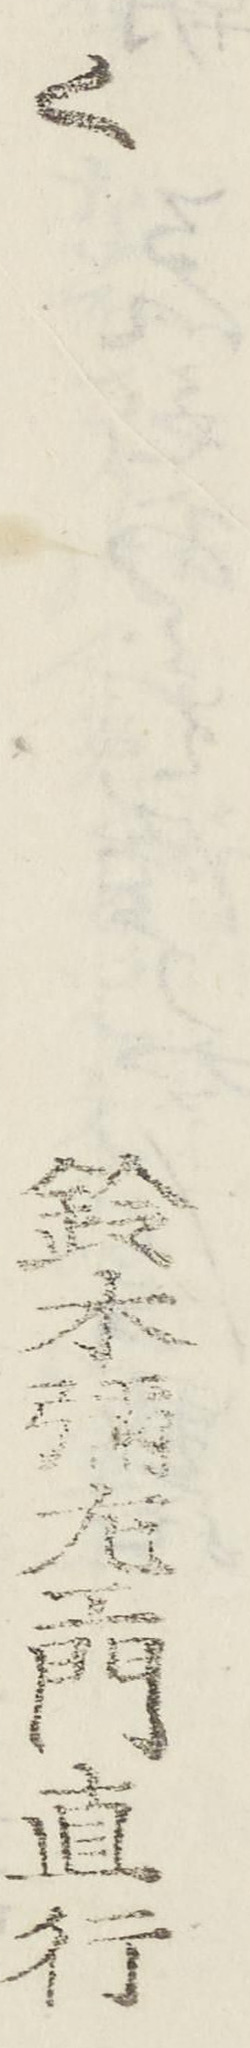く鈴木弥左エ門直行
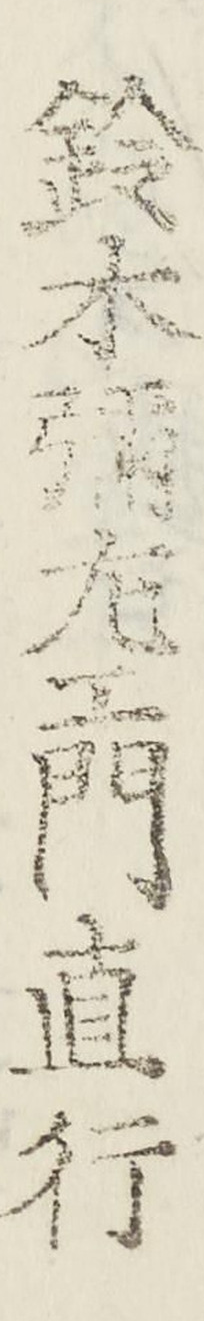く鈴木弥左エ門直行
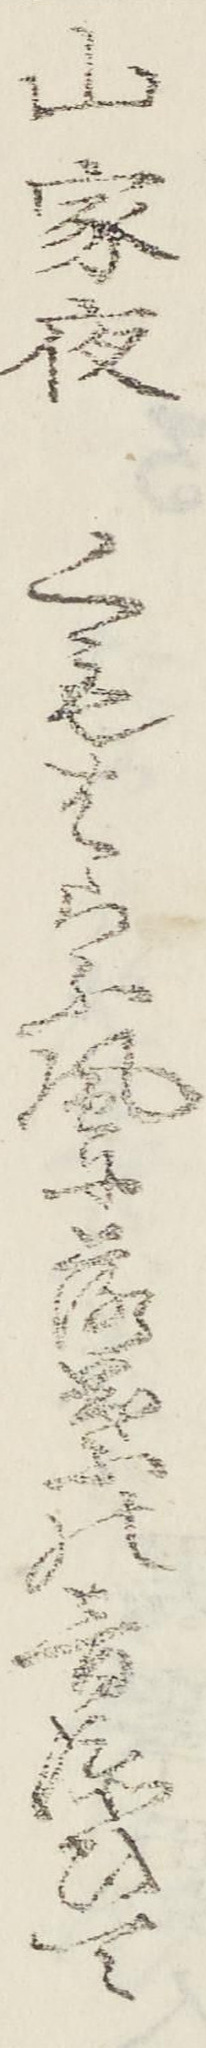山家夜くもはらふ風に落葉の音添ひて
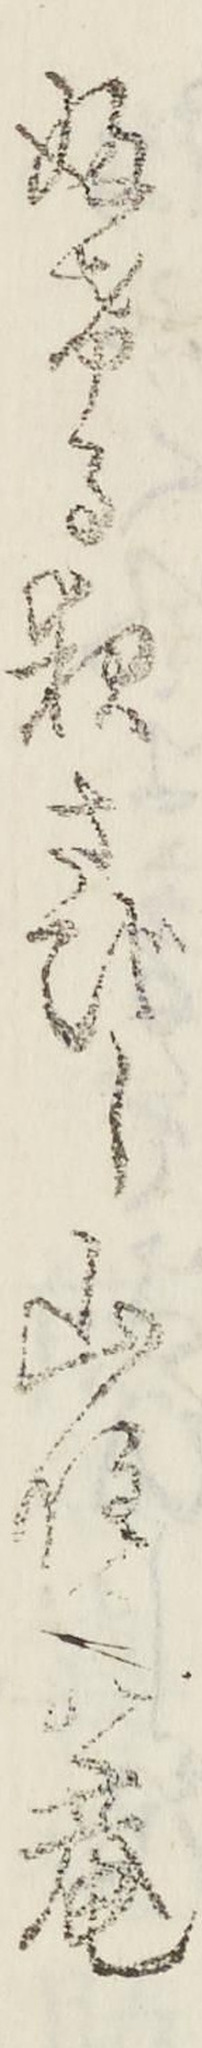ふける夜さびし山住の庵
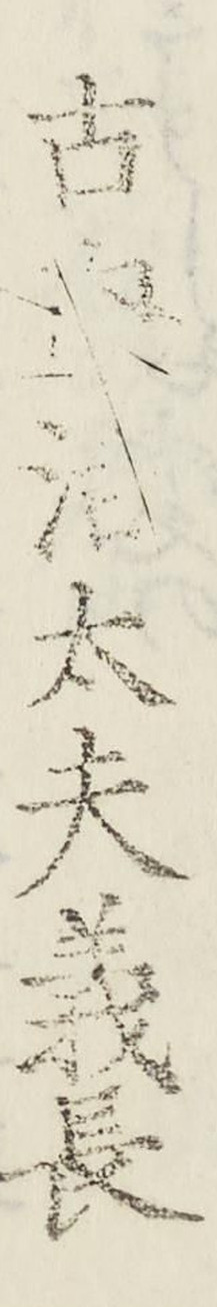は古内治太夫義長
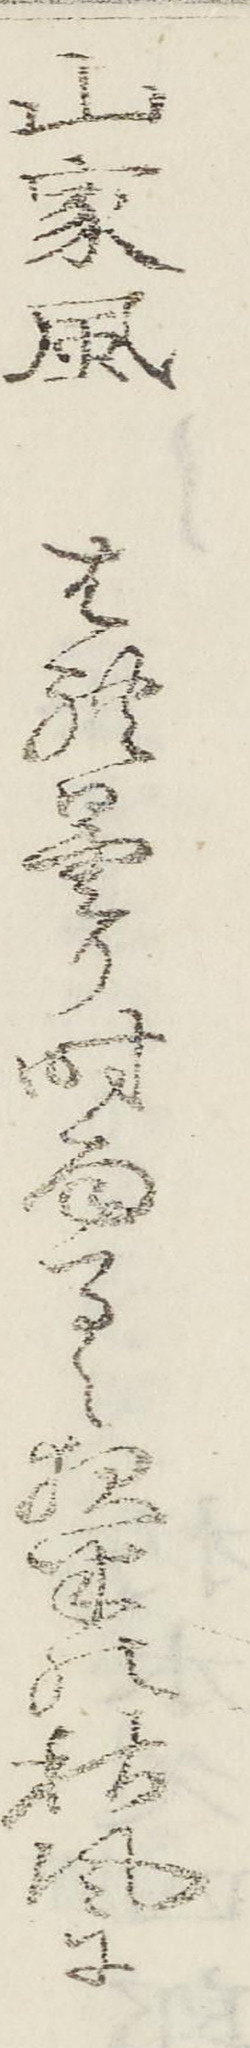山家風はれ曇り時雨るゝ夜半の秋風に
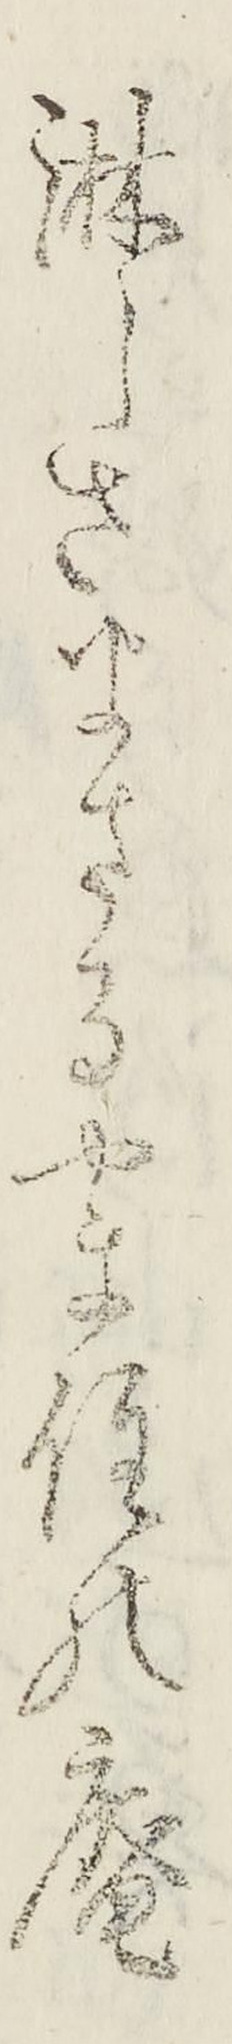淋しさまさるやま住の庵
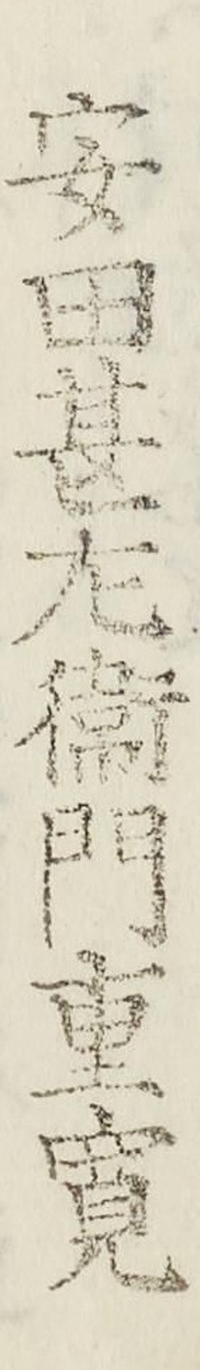う安田甚左衛門重寛
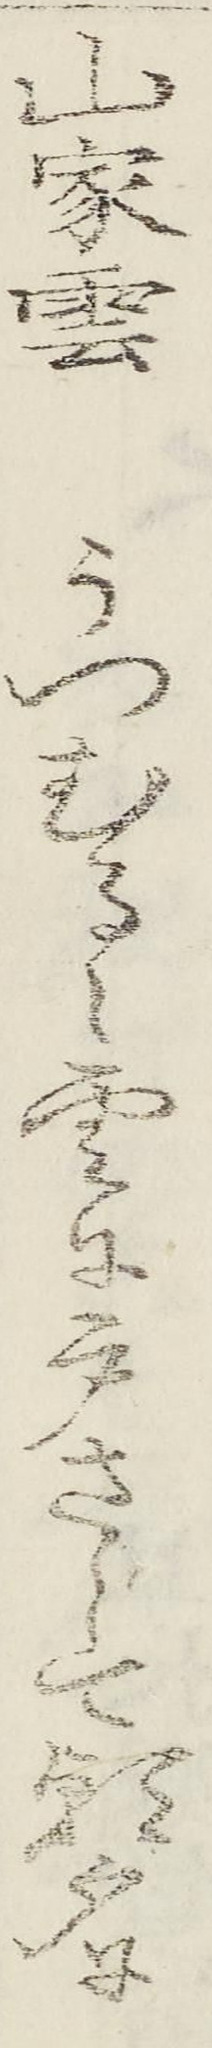山家雲うつむるゝ雲に戸さして朝夕に
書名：鎌先温泉由來記
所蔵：東京大学地震研究所図書室 Earthquake Research Institute Library, The University of Tokyo, JAPAN
